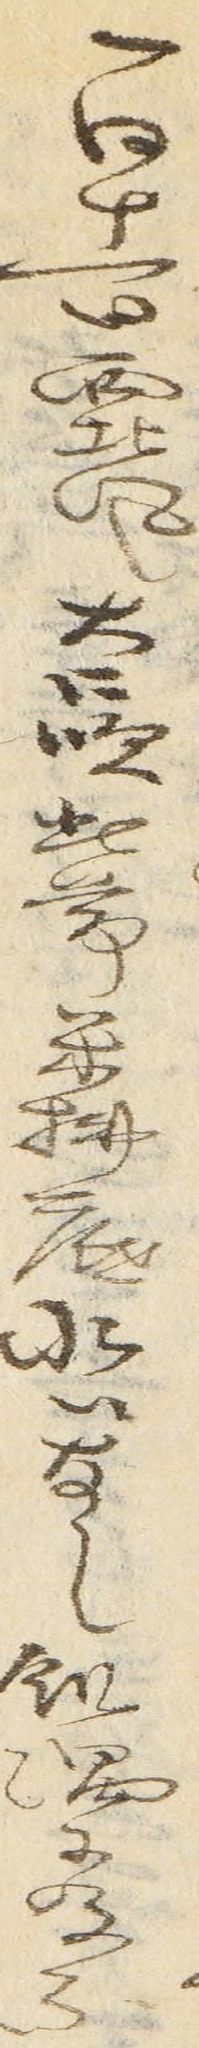一同十一日西北風大に吹此節米拂底水はなし飢渇に及ふ
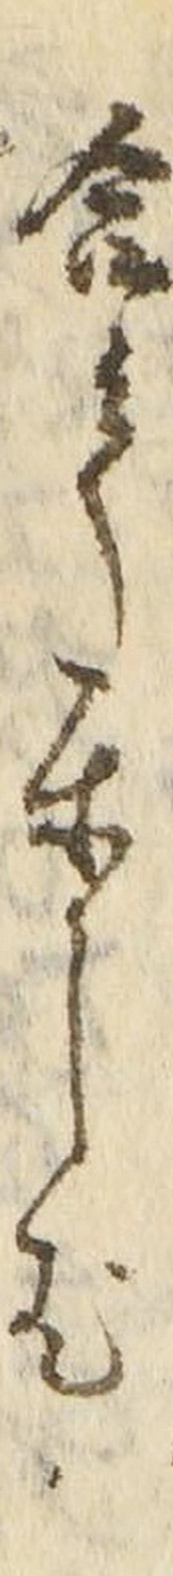合て楽しむ
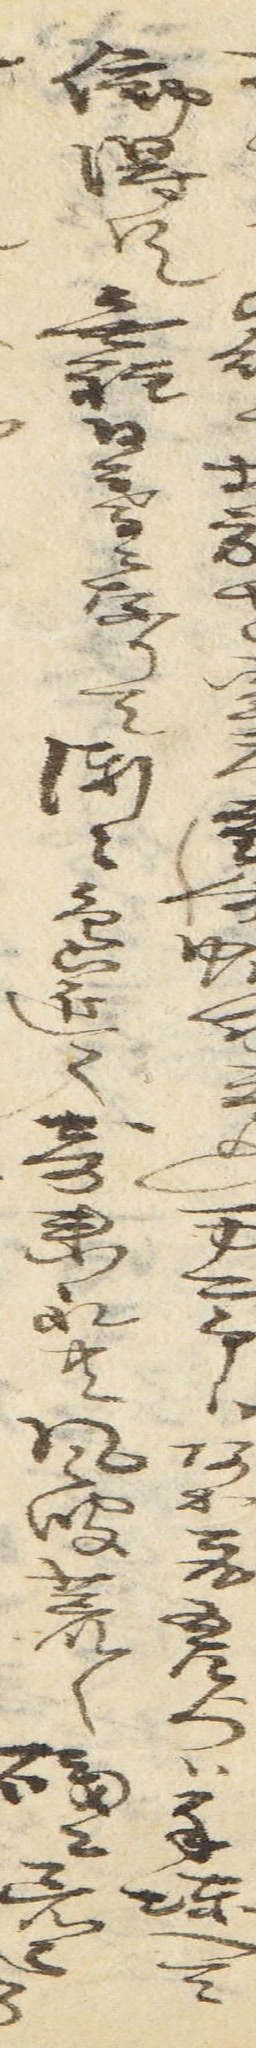働得す無程日暮になりて漸く嶋近く寄来れ共風波荒く磯に着く事
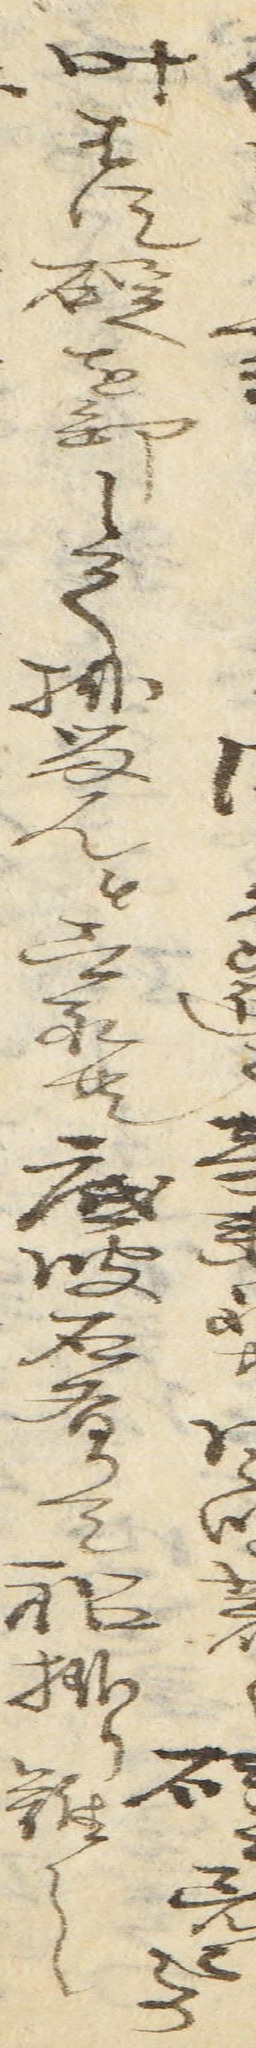叶はす碇を卸して掛留んとすれ共底波石有りて船掛り難し
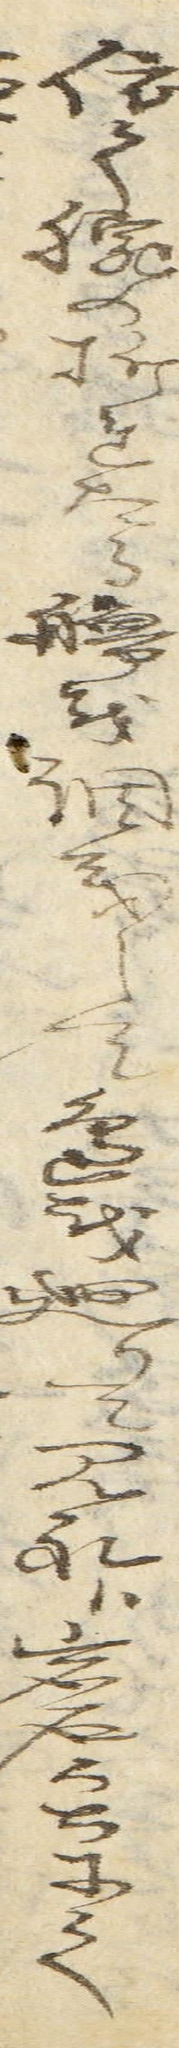依て腕の折れたる艪を調義して島を廻りて見れは岩石かちにて
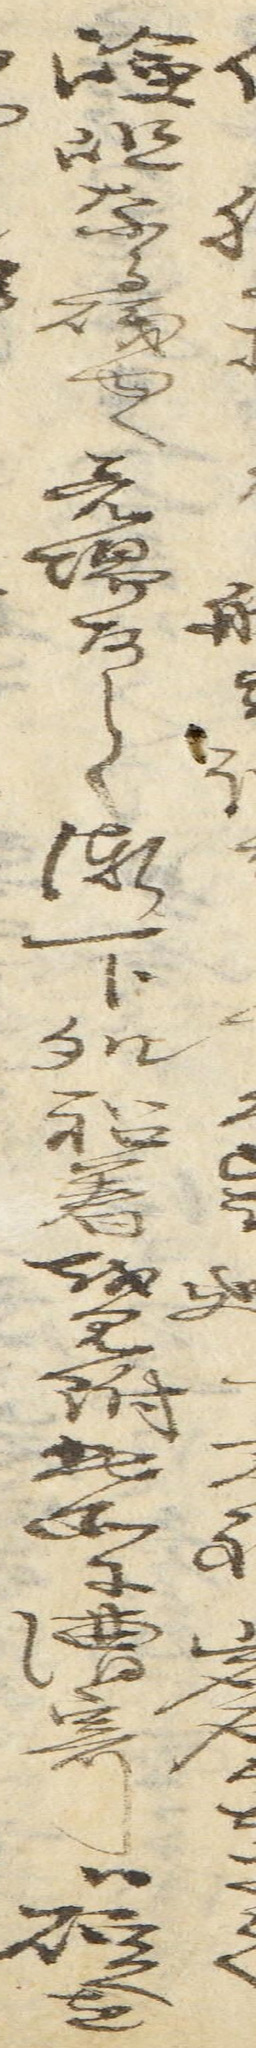嶮岨なる磯ゆへ着場なく漸一ト処船着を見附此所に漕寄は碇を
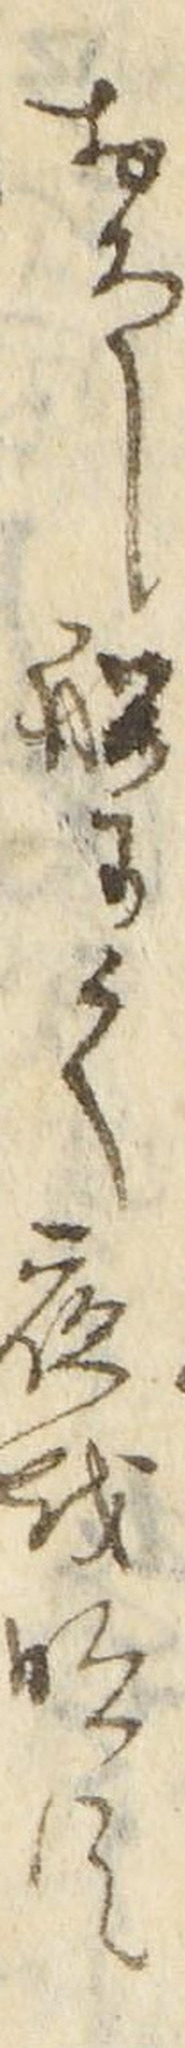おろし船にて夜を明す
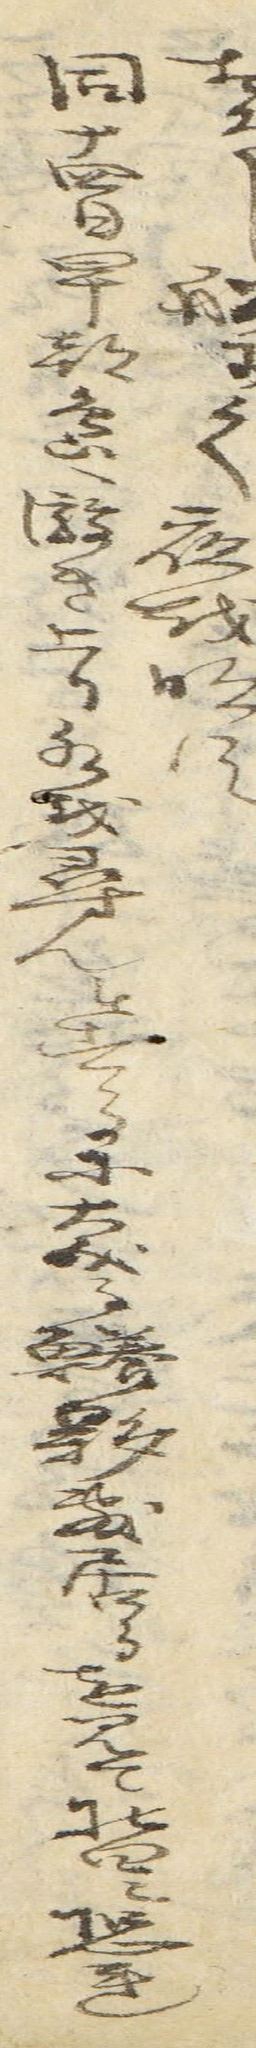一同十四日早朝島へ游き上り水を尋んとするに大成る鱶夥敷居るを見て皆々恐れ
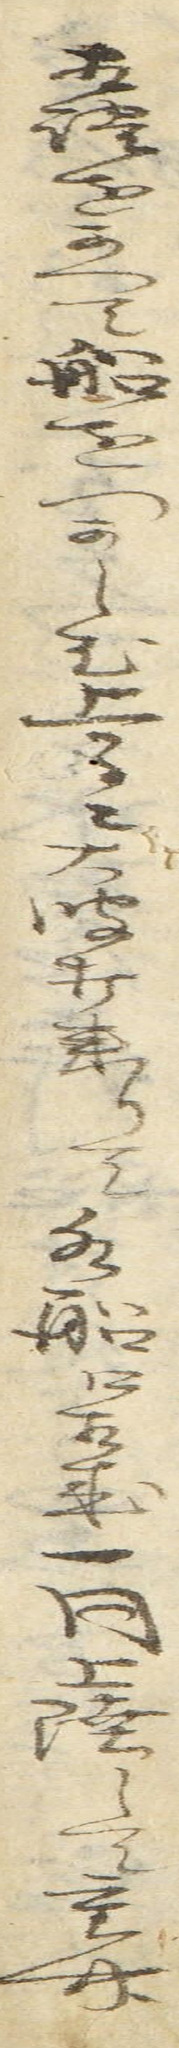相談をかへて船をつかしむ上るに大波打来りて水船に相成一同上陸して重介
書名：難船人帰朝記
